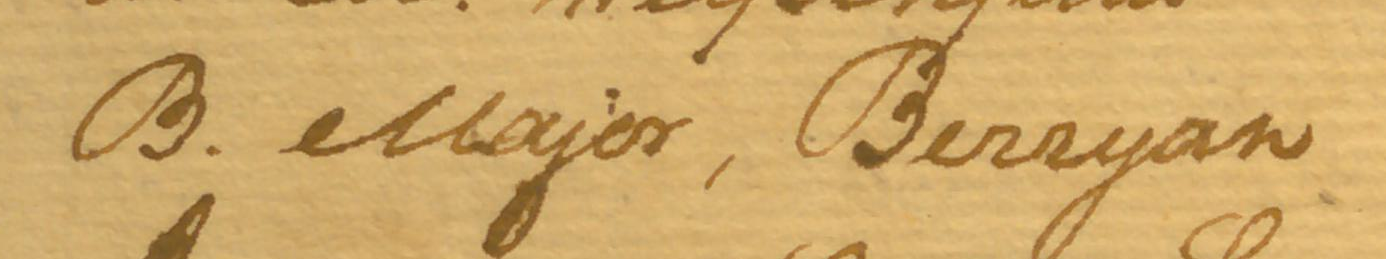B. Major, Berryan
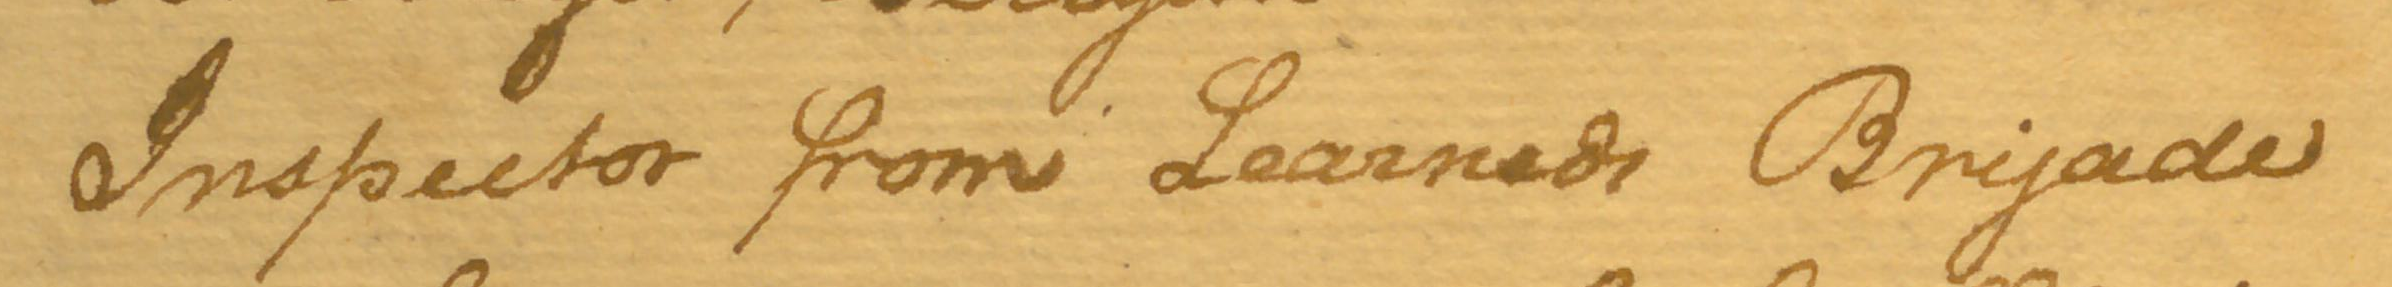Inspector from Learneds Brigade
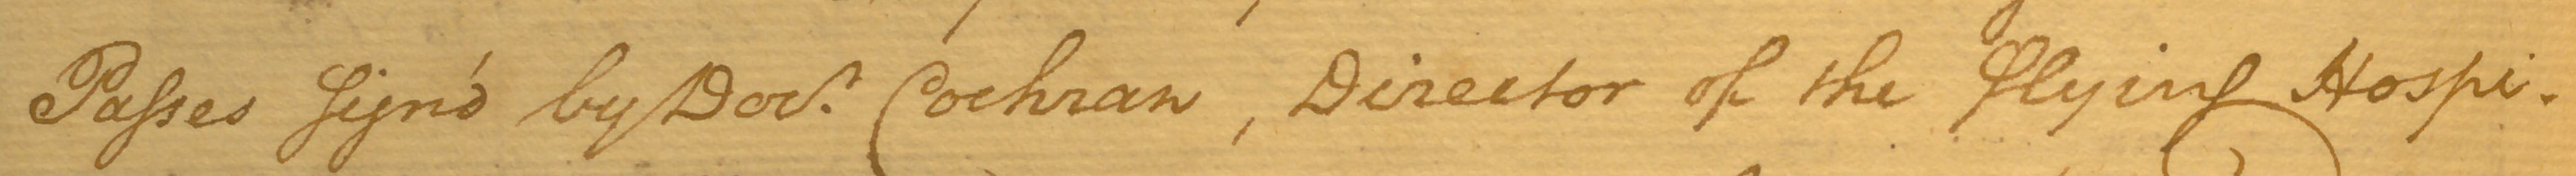Passes sign'd by Doc^r. Cochran, Director of the flying Hospi-
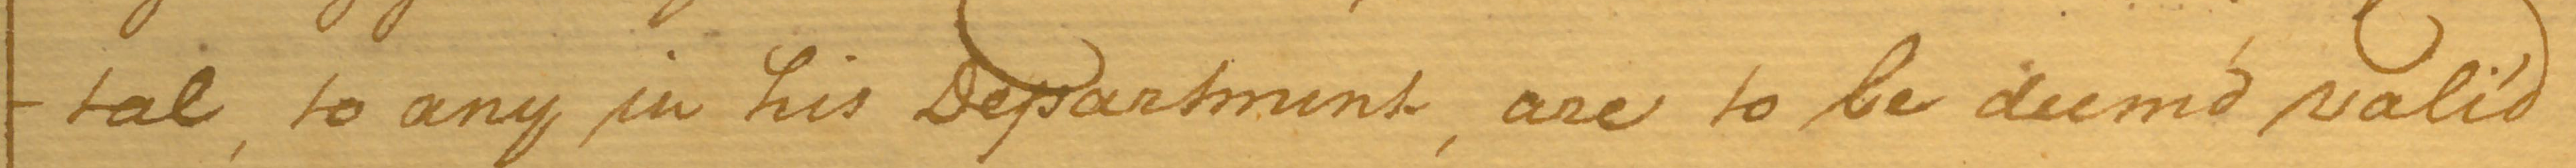-tal, to any in his Department, are to be deem'd vali'd
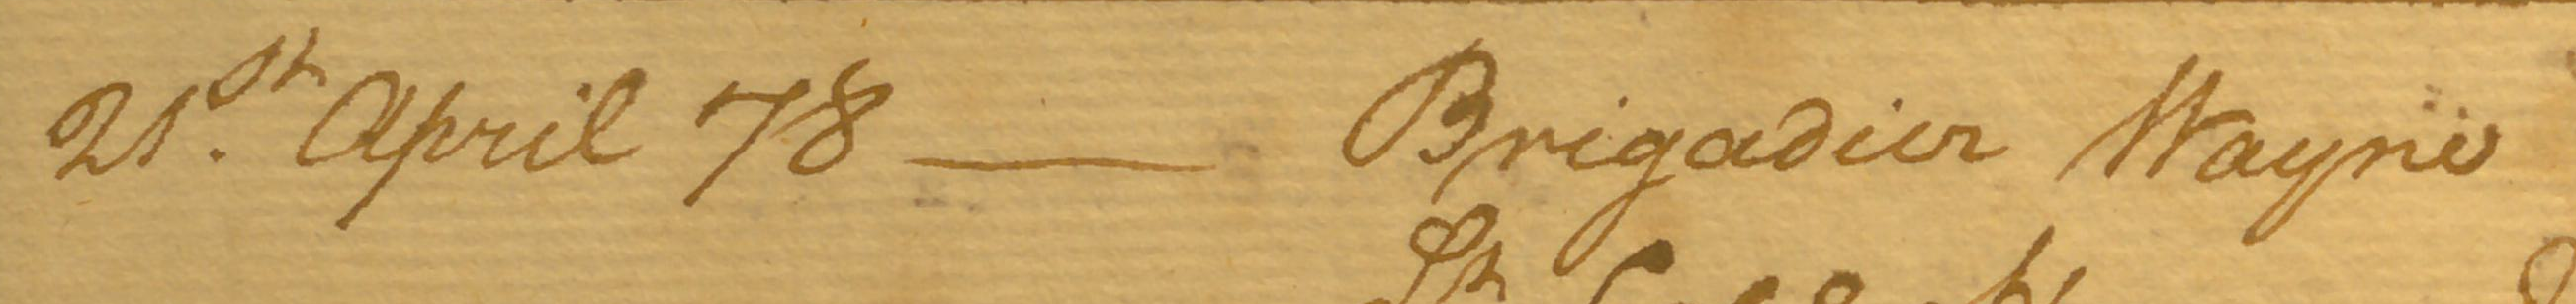21^st. April 78- Brigadier Wayne
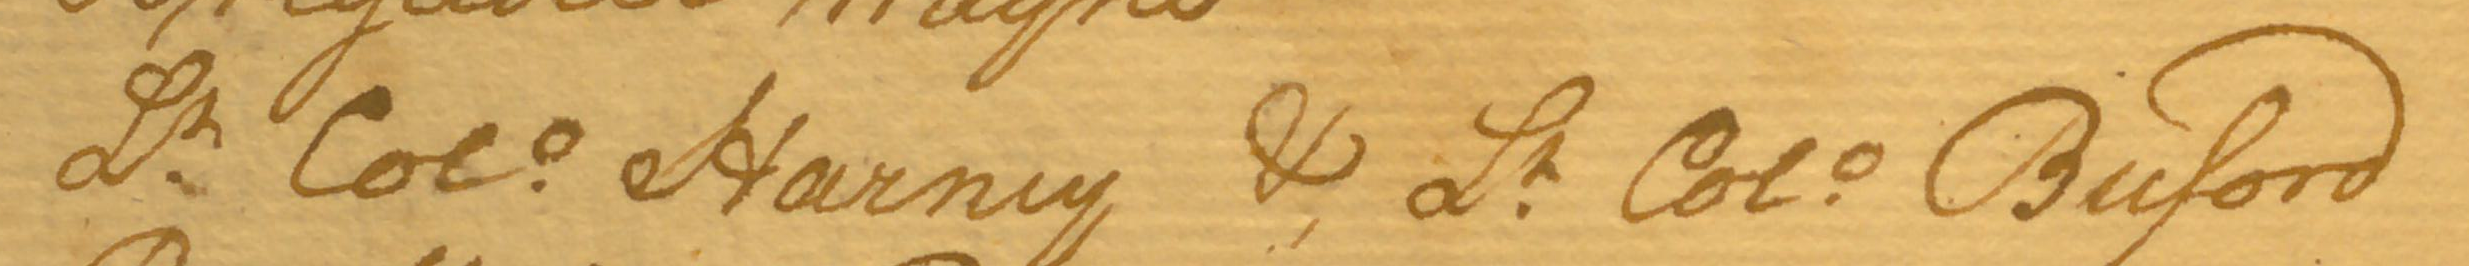L^t. Col^o. Harney & L^t. Col^o. Buford
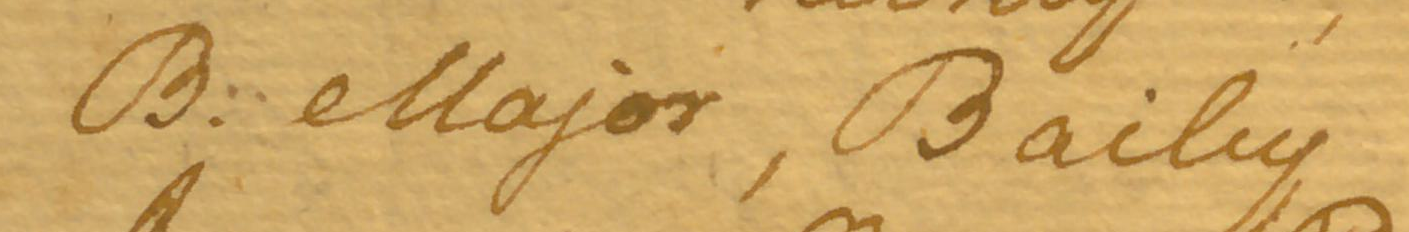B. Major, Bailey
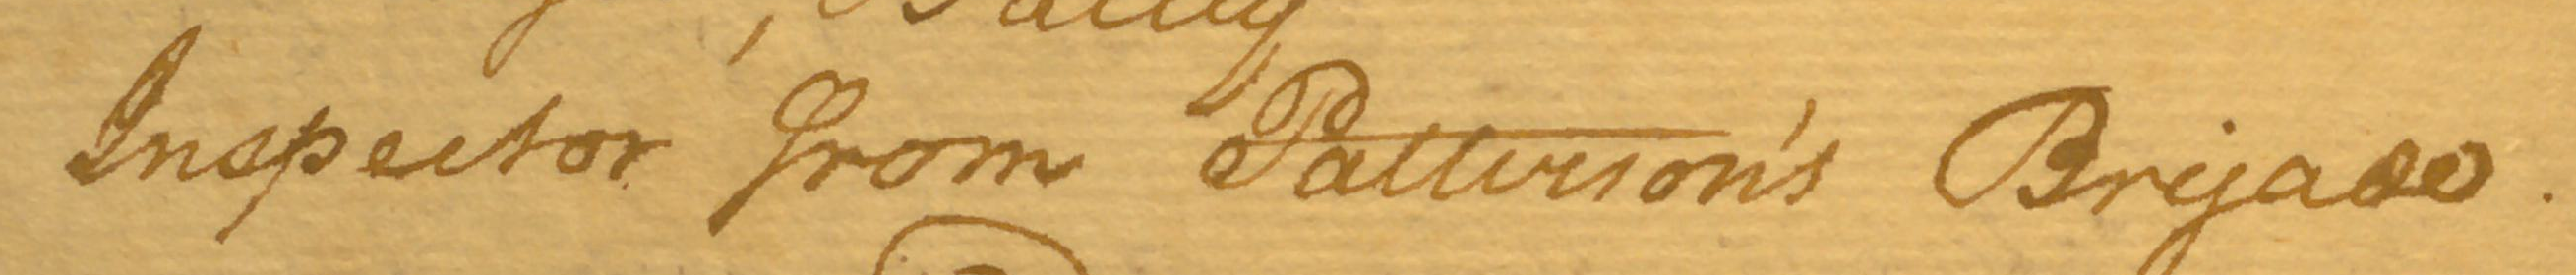Inspector from Patterson's Brigade
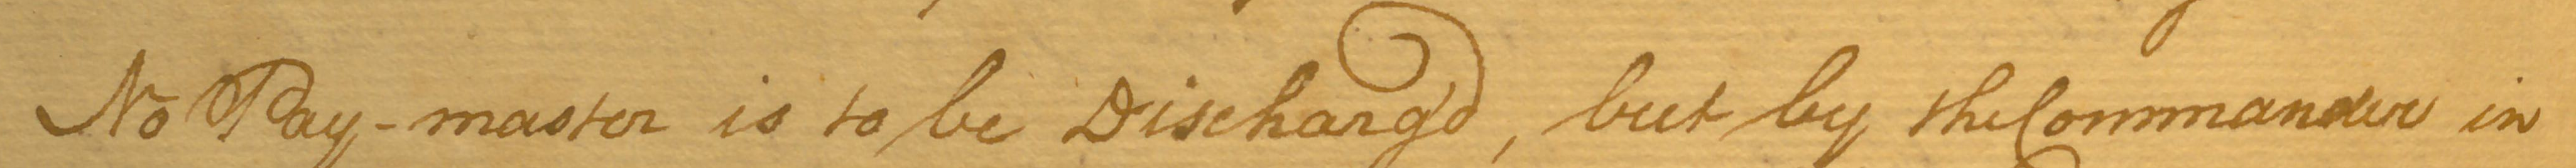No Pay-master is to be Discharg'd, but by the Commander in
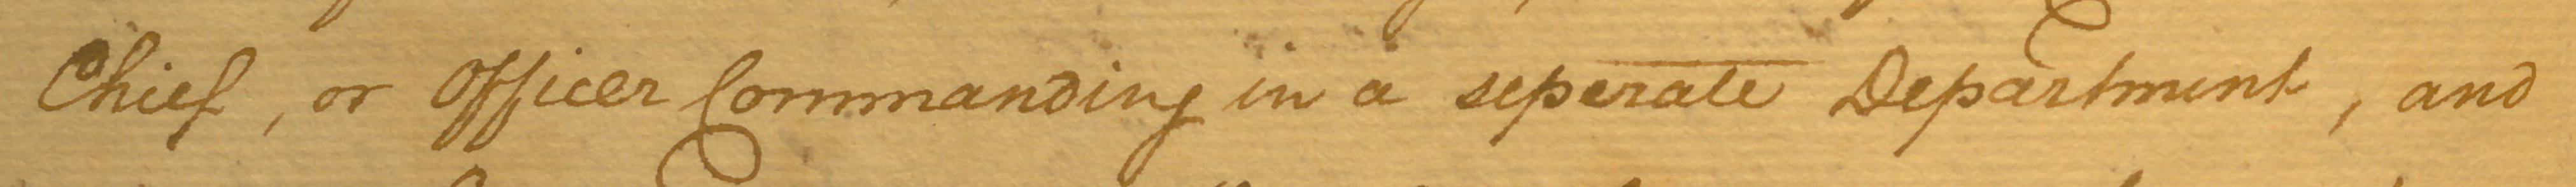Chief, or officer Commanding in a separate Department, and
